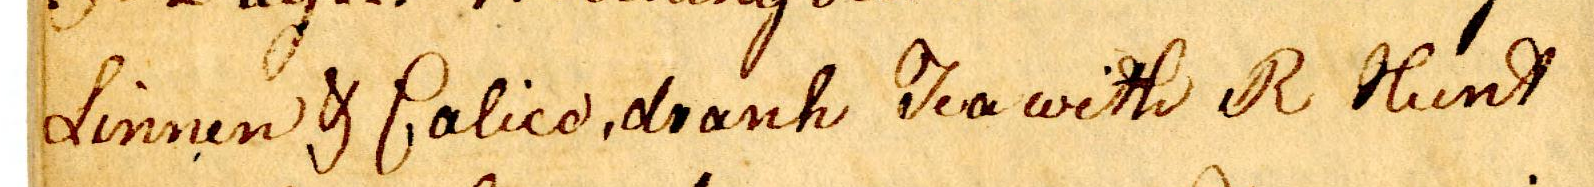Linnen & Calico, drank Tea with R Hunt
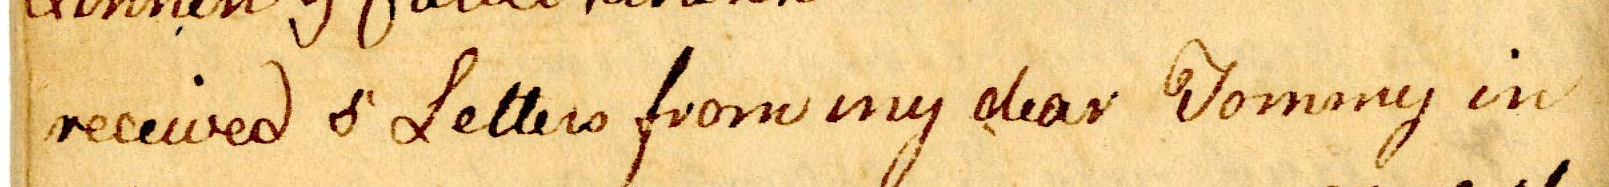received 5 Letters from my dear Tommy in
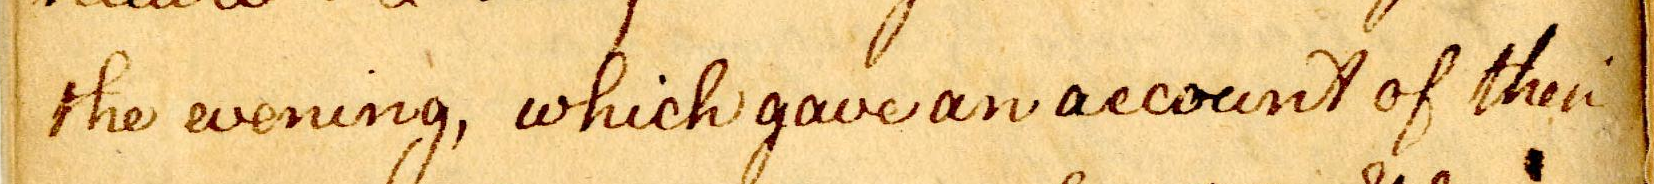the evening, which gave an account of their
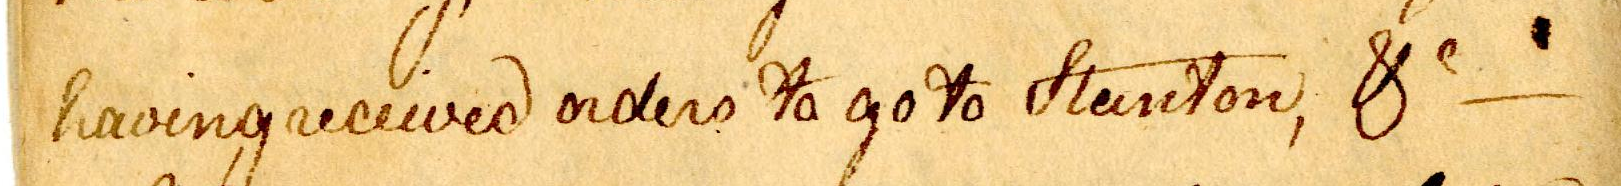having received orders to go to Stanton, &^c-
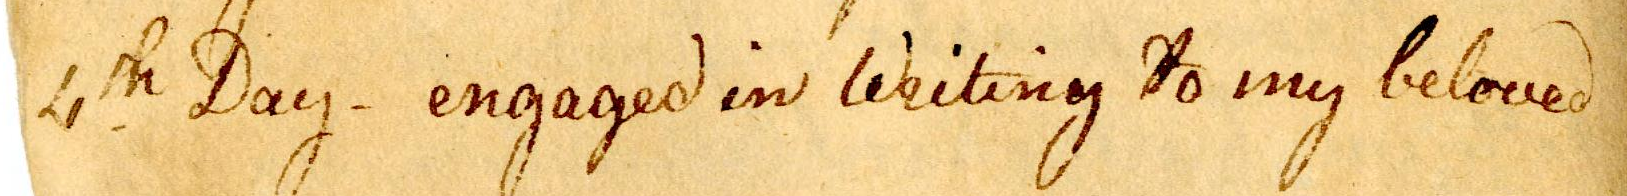4^th Day- engaged in Writing to my beloved
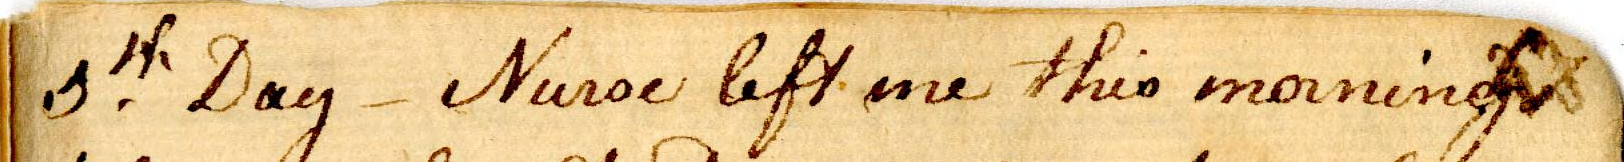5^th Day- Nurse left me this morning 67
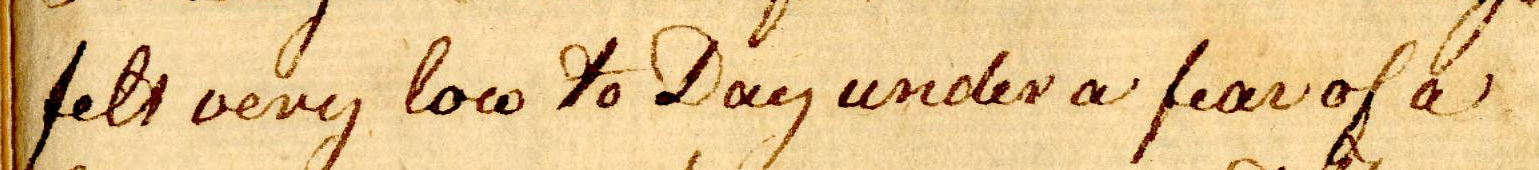felt very low to Day under a fear of a
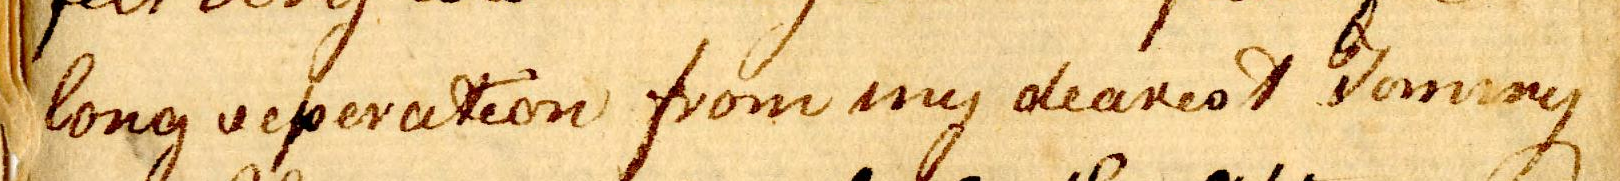long seperation from my dearest Tommy
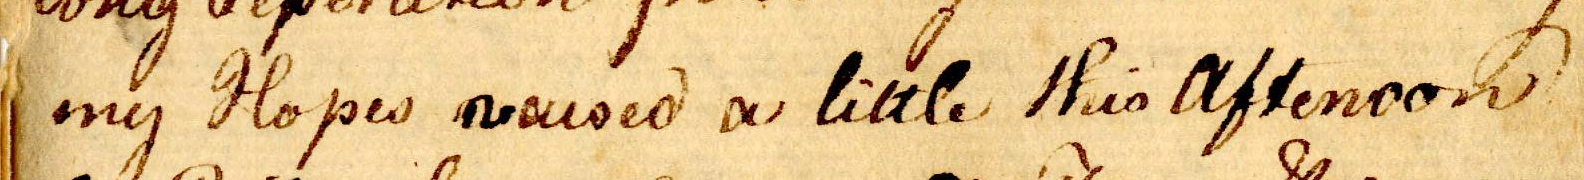my Hopes raised a little this Aftenoon
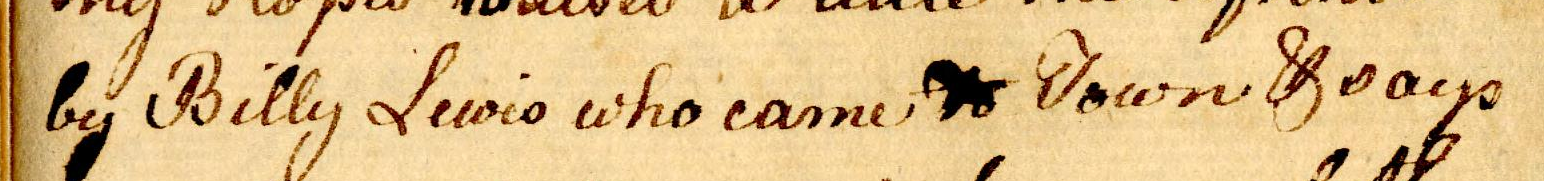by Billy Lewis who came to Town & says
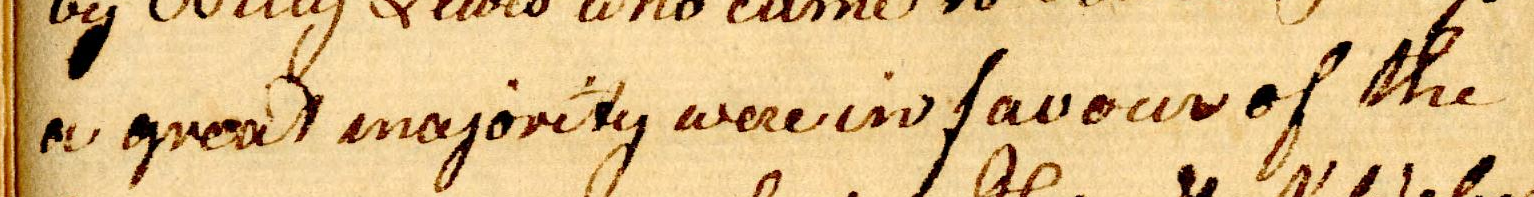a great majority were in favour of the
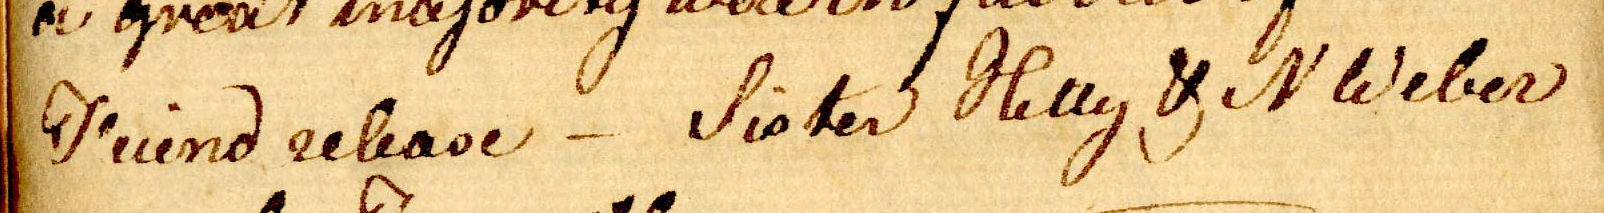Friend release- Sister Hetty & N Weber
